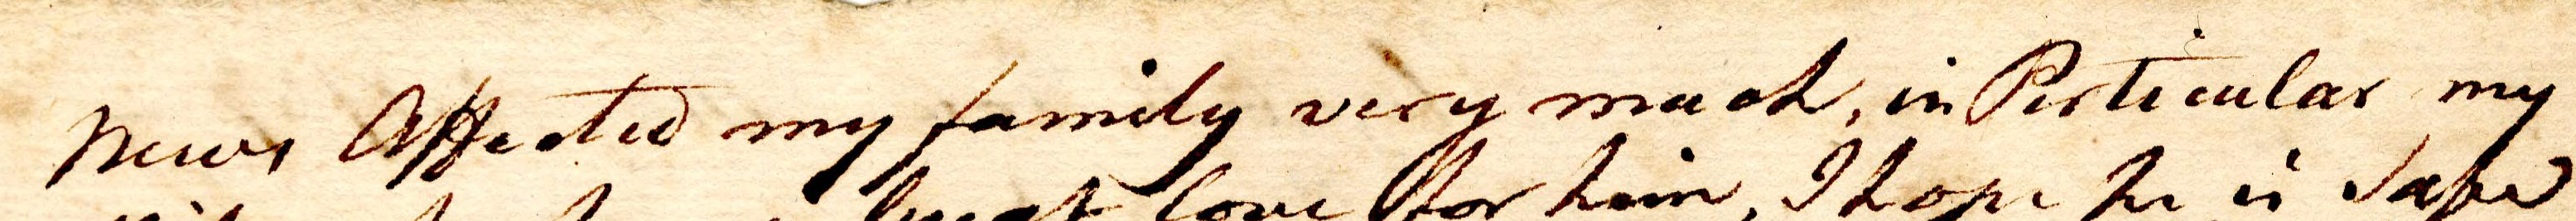news affected my family very much, in Particular my
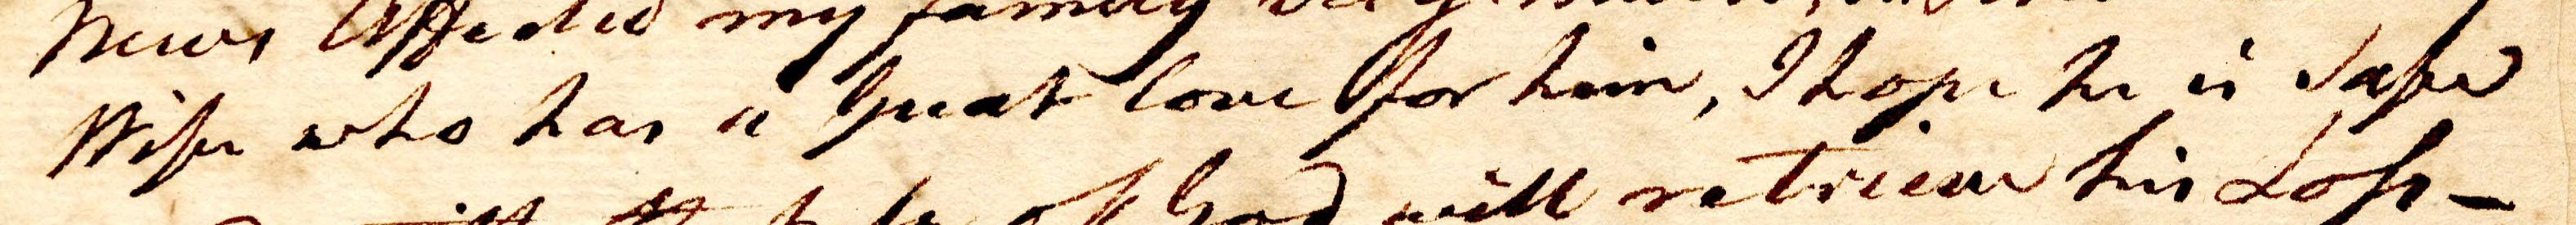Wife who has a great care for him, I hope he is safe
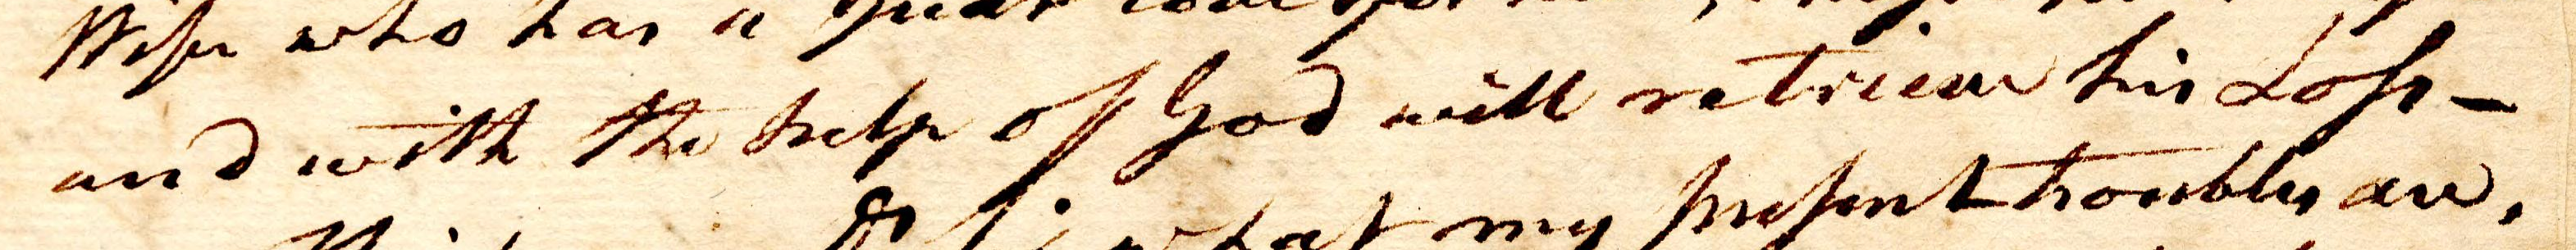and with the help of god will retrieve his Loss.-
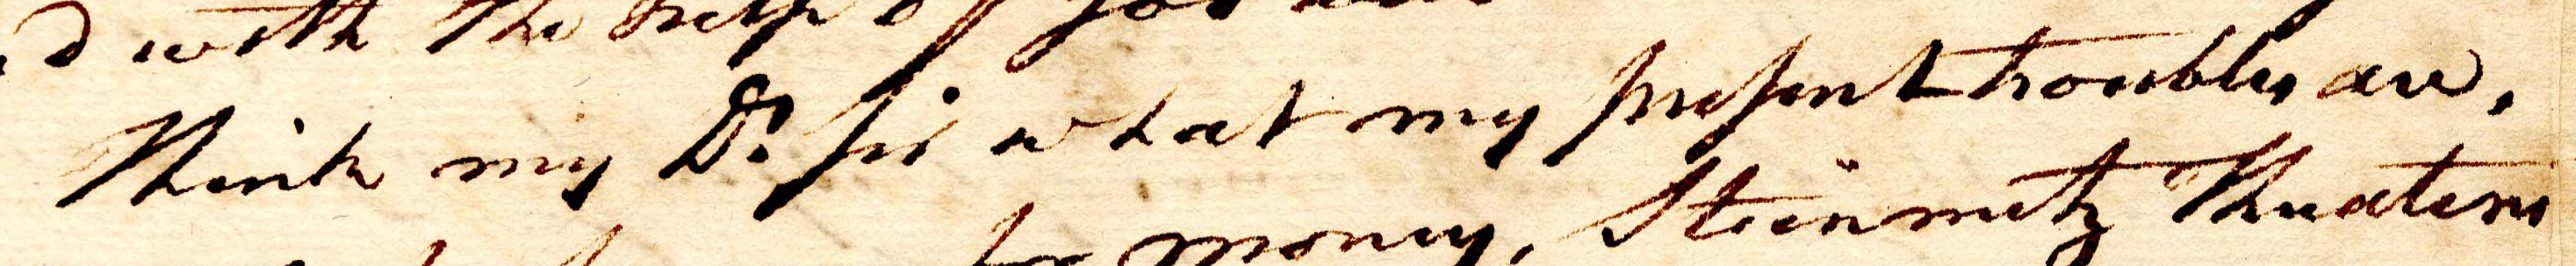Think my D^r. sir what my present troubles are,
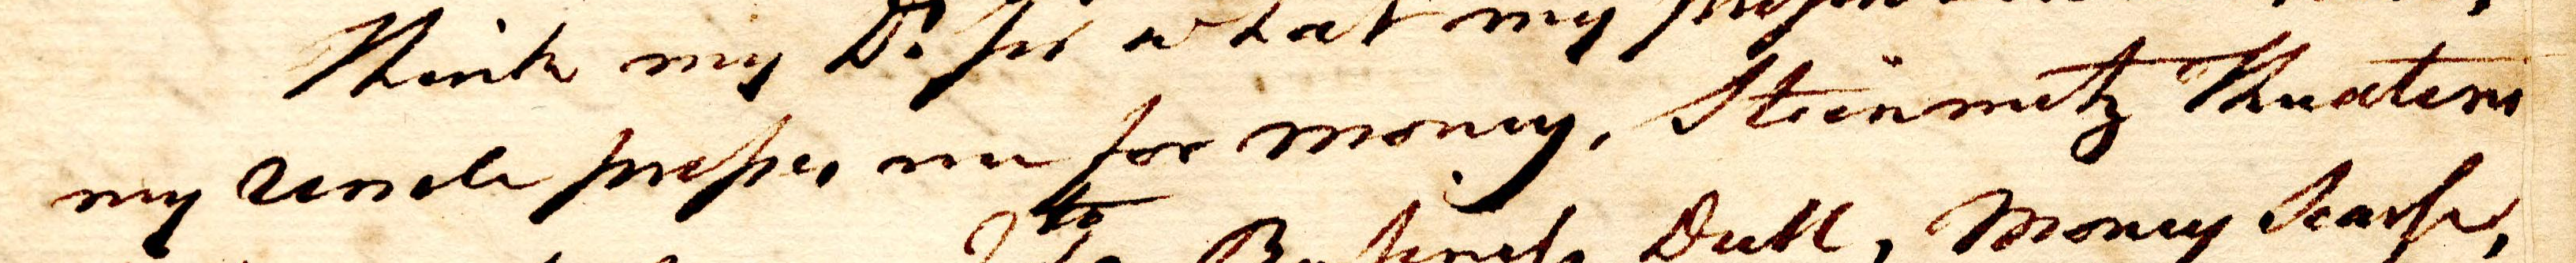my uncle presses me for money, Stienmetz threatens
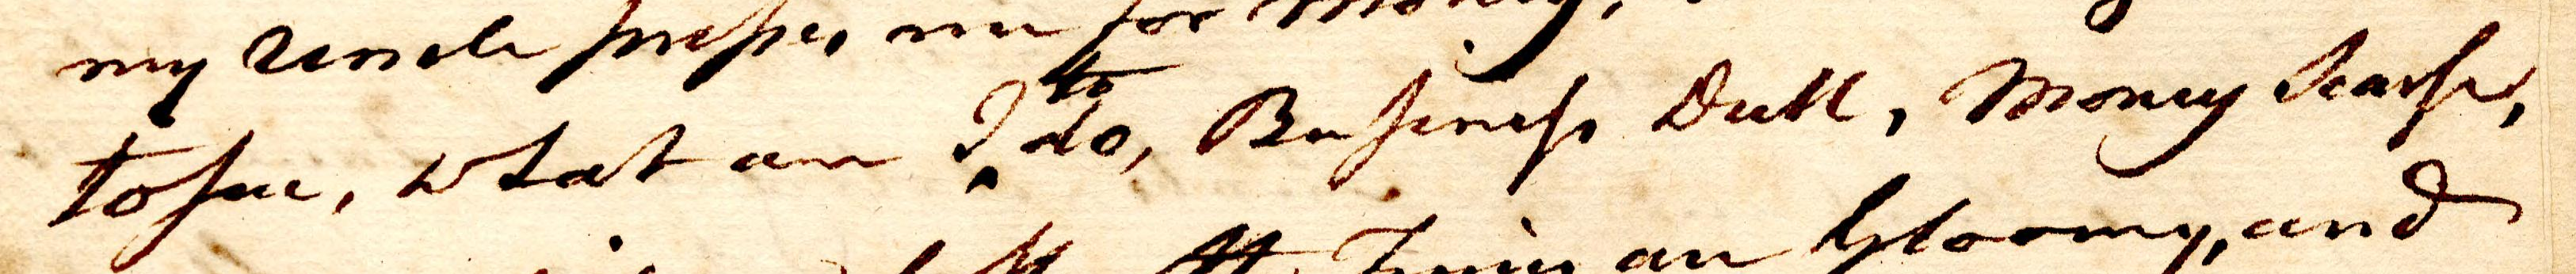to sue, & what am I do, Business Dull, Money Scarse,
